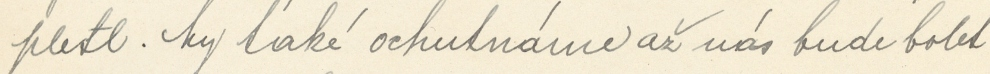pletl. My také ochutnáme až nás bude bolet
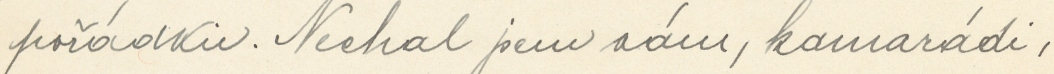pořádku. Nechal jsem vám, kamarádi,
